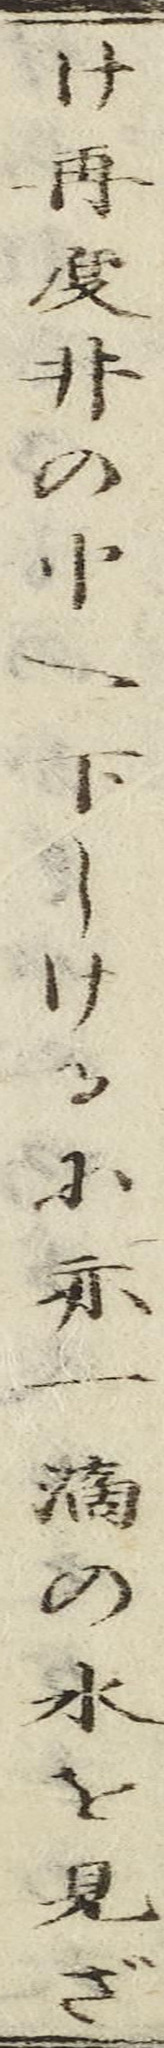け再度井の中へ下しけるに亦一滴の水を見ざ
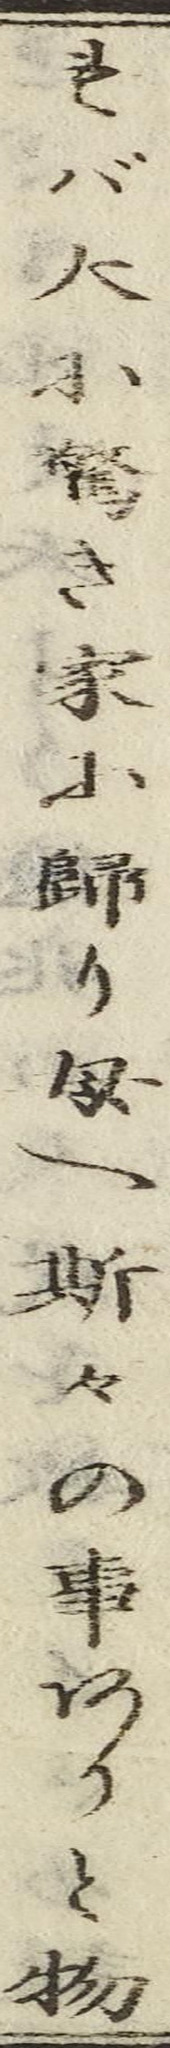れば大に驚き家に帰り母へ斯々の事ありと物
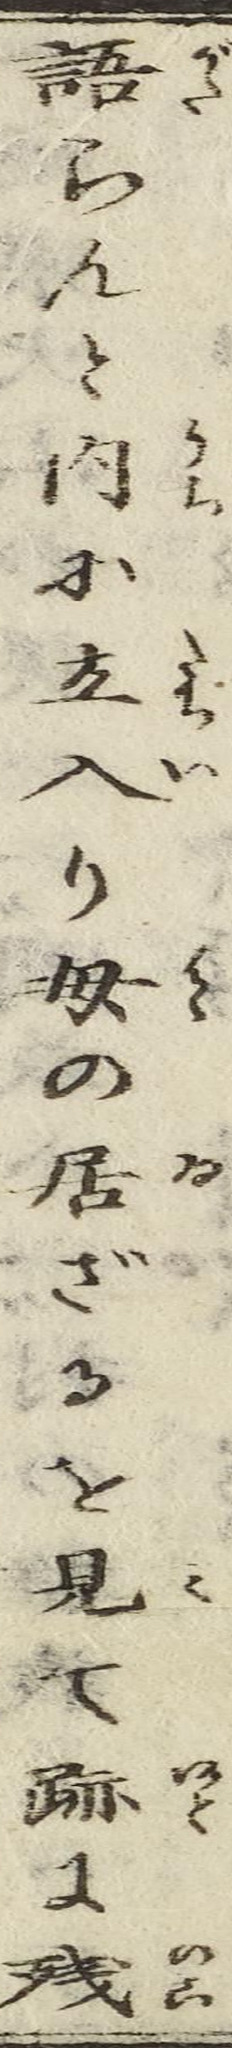語らんと内に立入り母の居ざるを見て跡に残
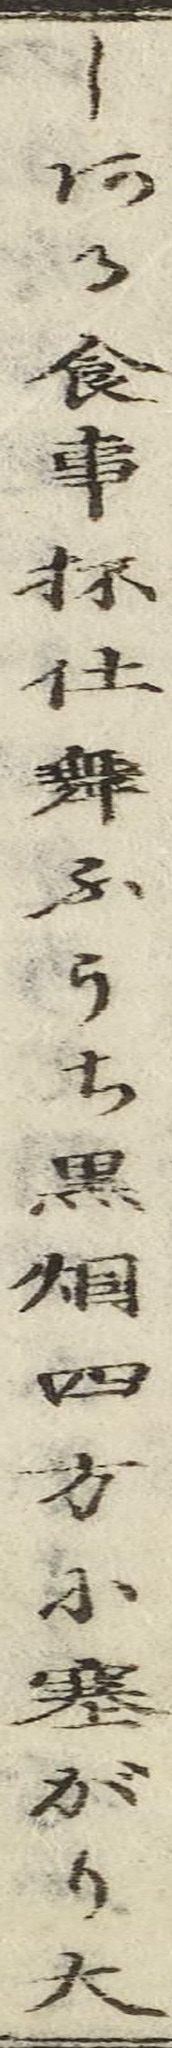したる食事抔仕舞ふうち黒烟四方に塞がり大
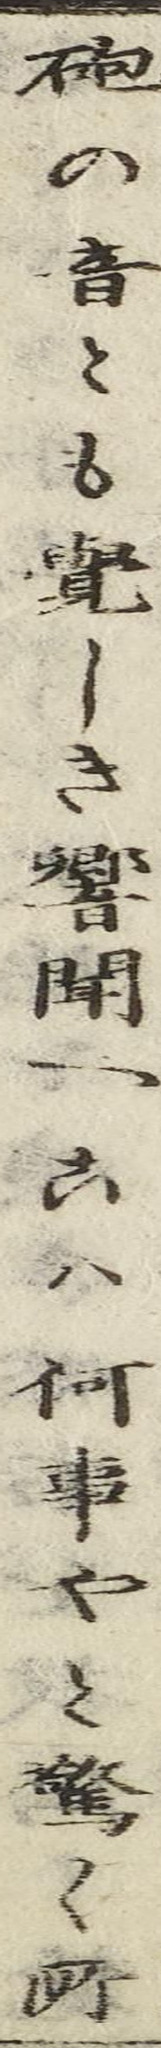砲の音とも覚しき響聞へこは何事やと驚く所
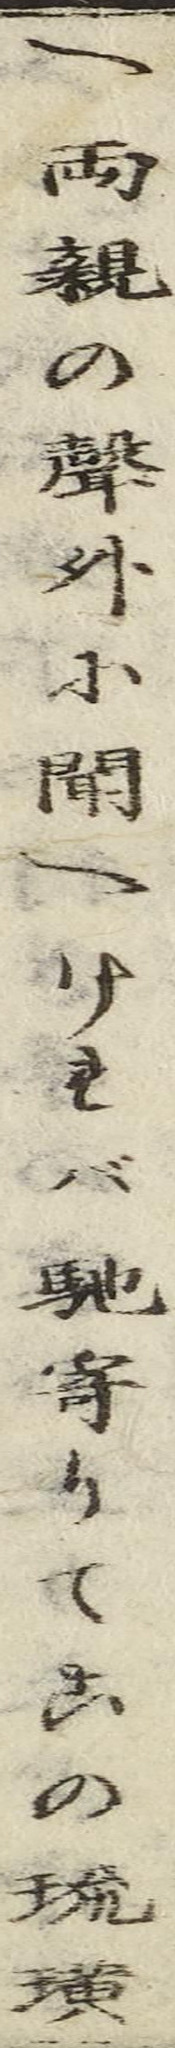へ両親の声外に聞へければ馳寄りてこの琉璜
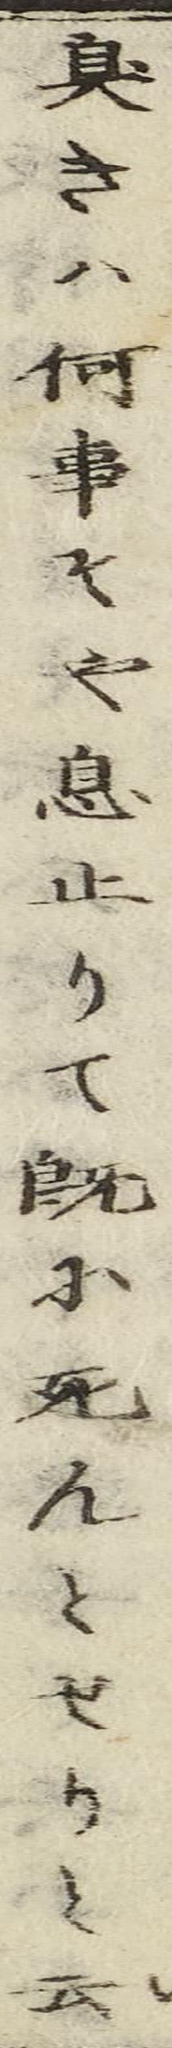臭きは何事そや息止りて既に死んとせりと云
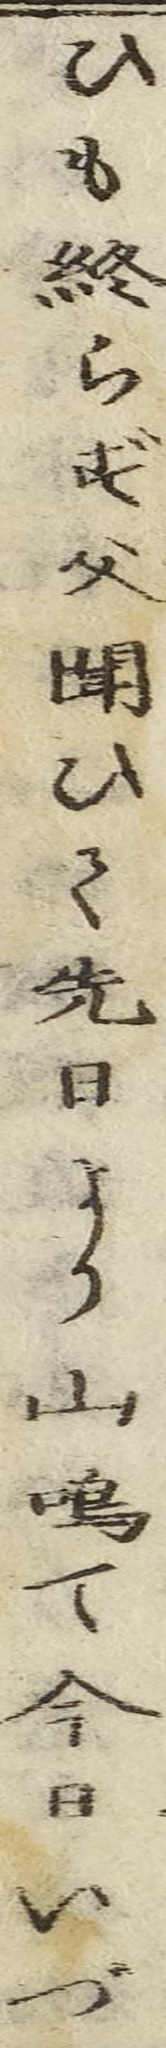ひも終らず父聞ひて先日より山鳴て今日いづ

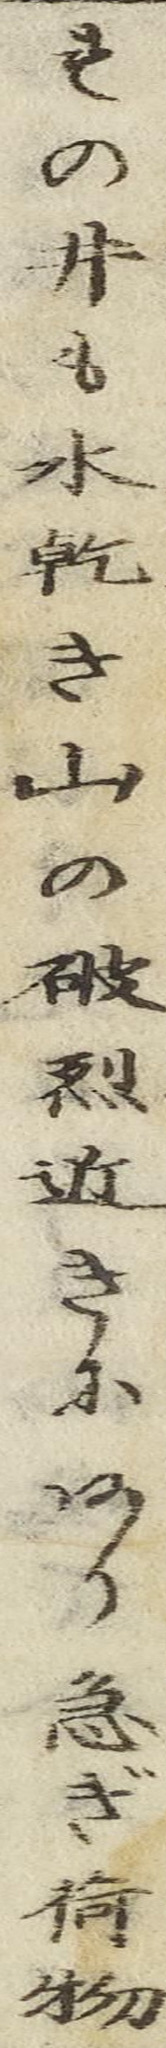れの井も水乾き山の破烈近きにあり急ぎ荷物
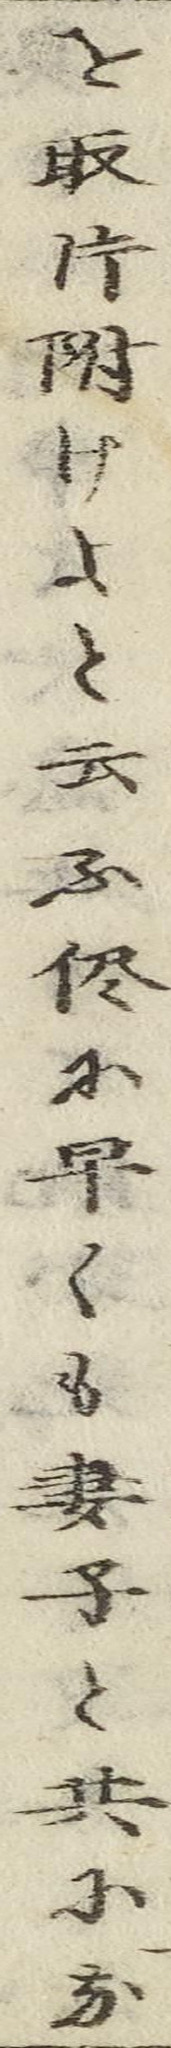を取片附けよと云ふ侭に早くも妻子と共に「な
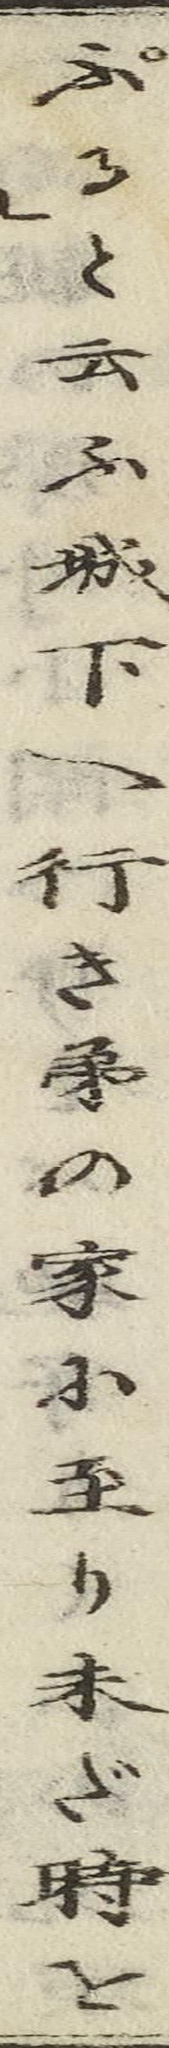ぷる」と云ふ城下へ行き弟の家に至り未だ時を
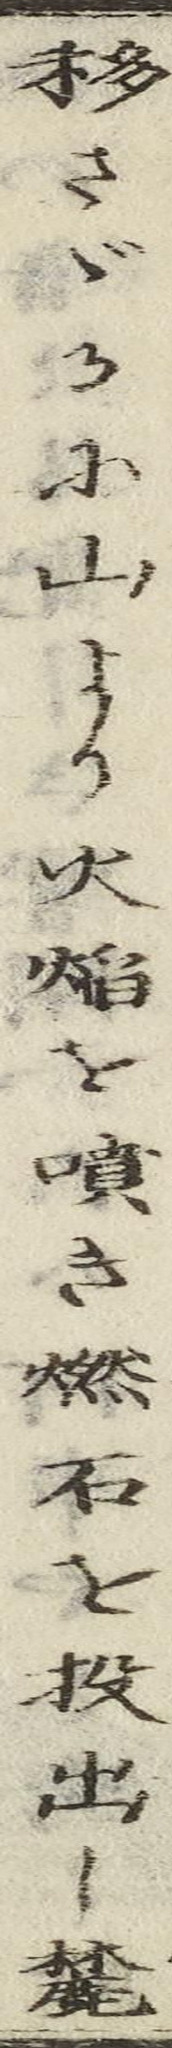移さゞるに山より火焔を噴き燃石を投出し麓
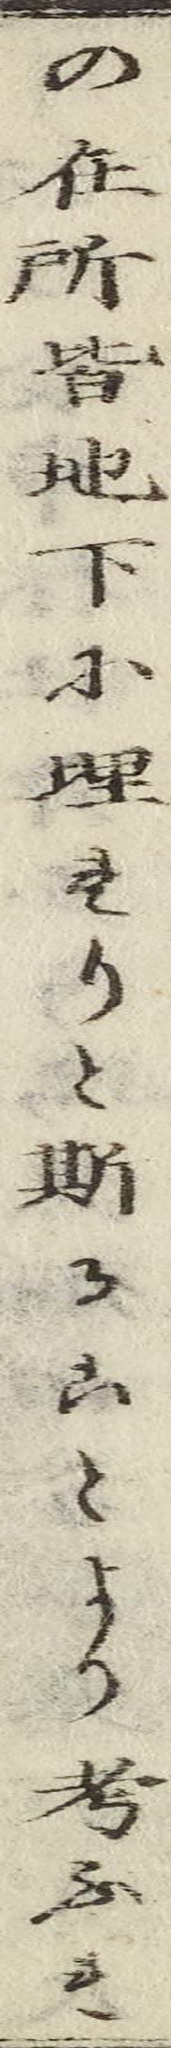の在所皆地下に埋れりと斯ることより考ふれ
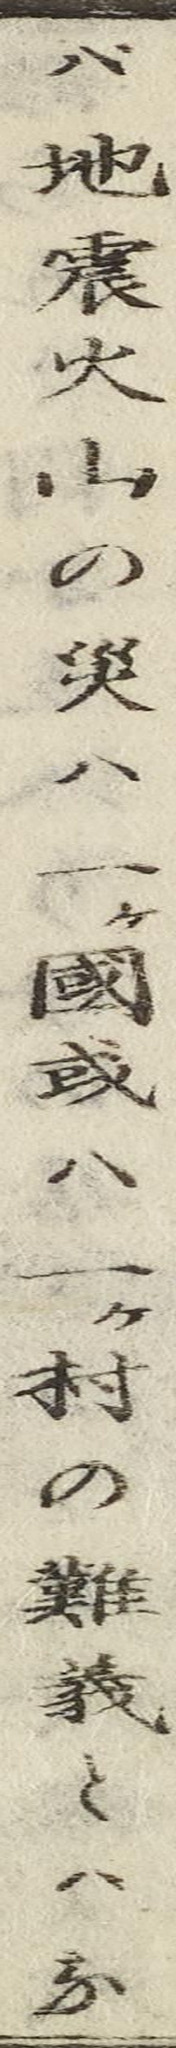ば地震火山の災は一ケ国或は一ケ村の難義とはな
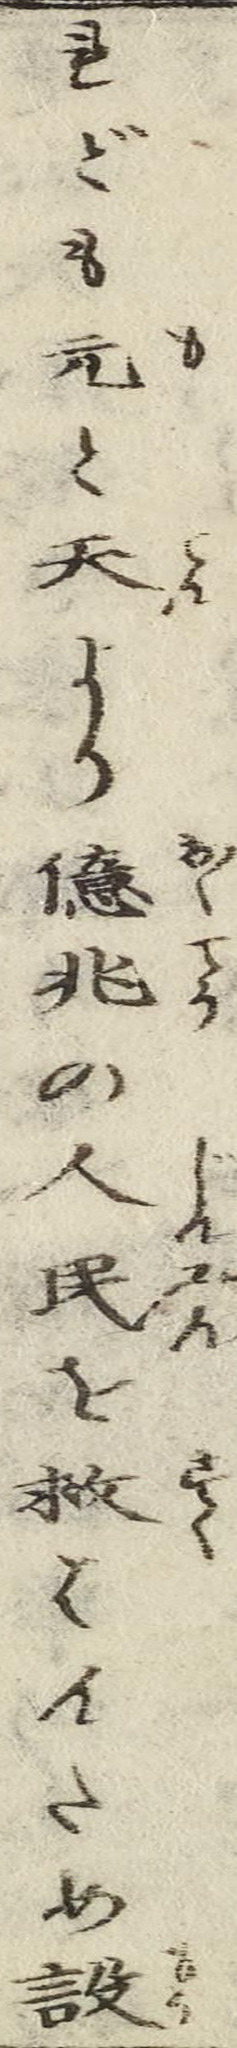れども元と天より億兆の人民を救はんため設
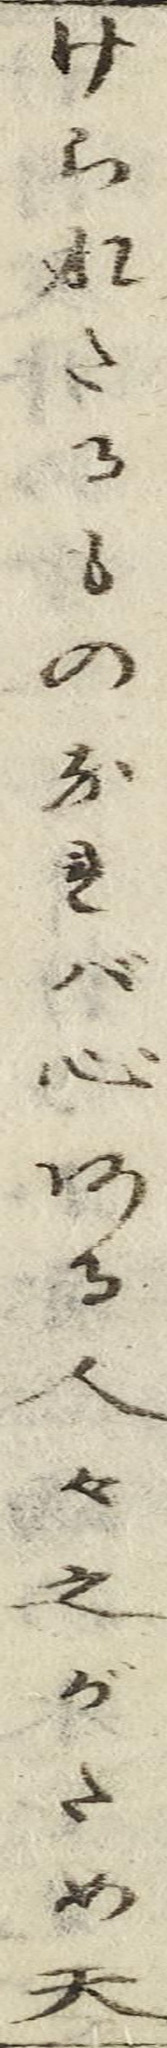けられたるものなれば心ある人々之がため天
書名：天変地異
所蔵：東京大学地震研究所図書室 Earthquake Research Institute Library, The University of Tokyo, JAPAN
